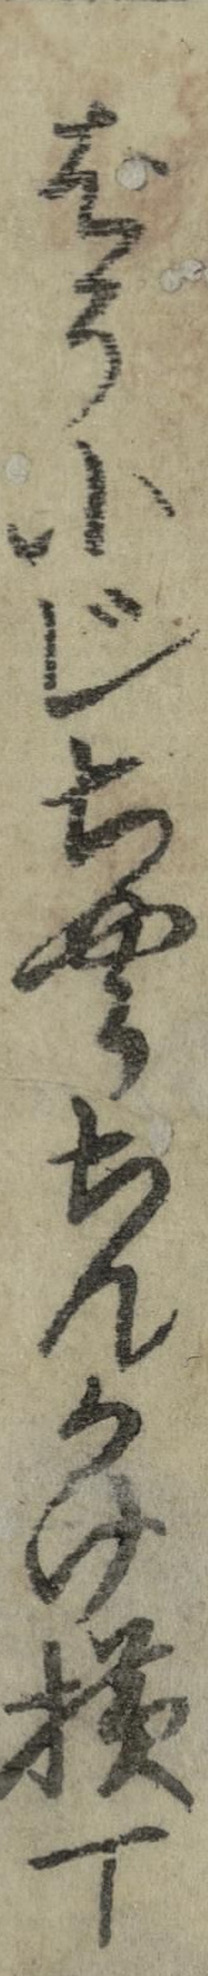はう小じちやうちんかけ横丁
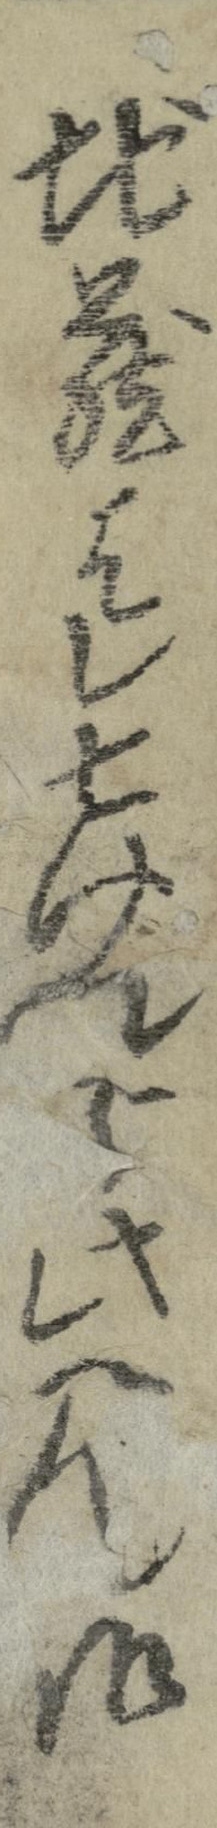地蔵はし七けん丁此へん御
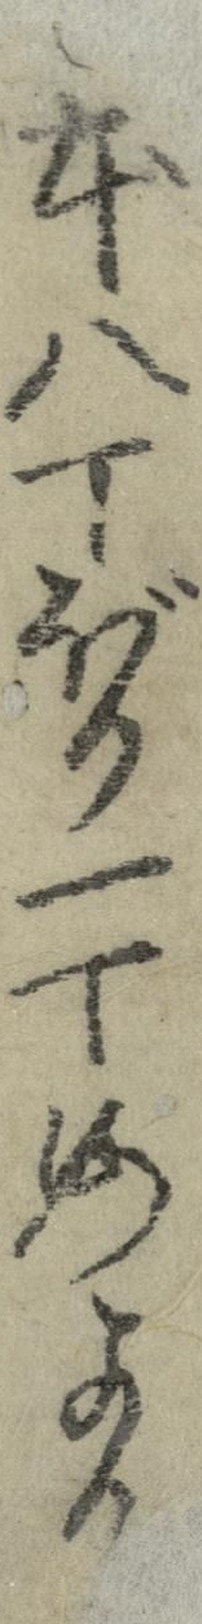本八丁ぼり一丁めより
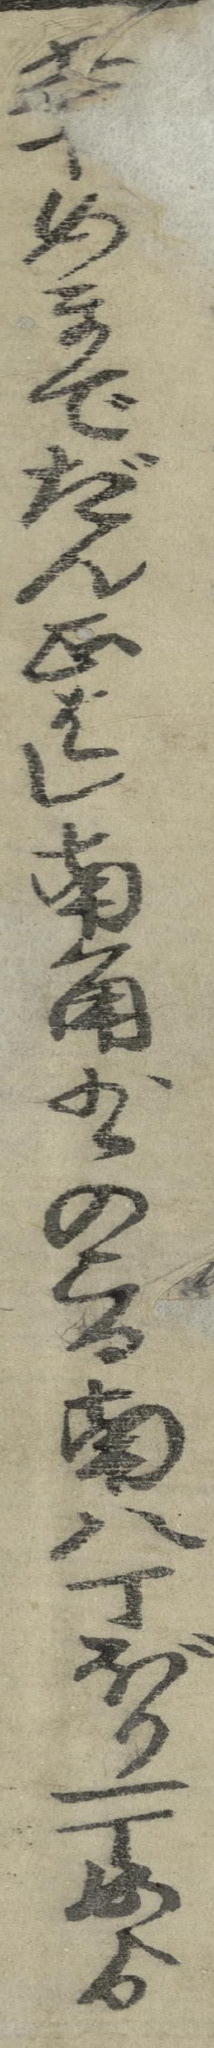丁めまでだん正ばし南角少々のこる南八丁ぼり一丁めゟ
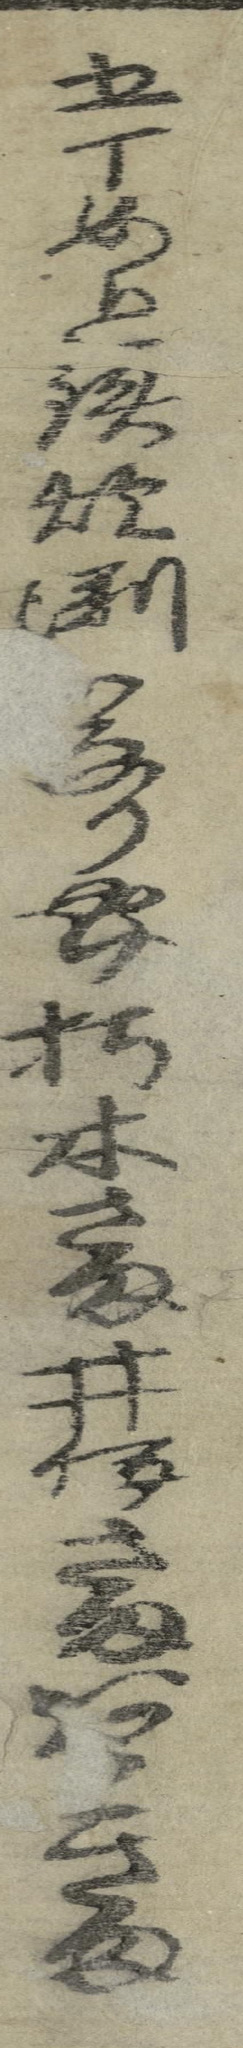五丁め迄鉄炮洲いなりやけ朽木さま井伊さま阿ハさま
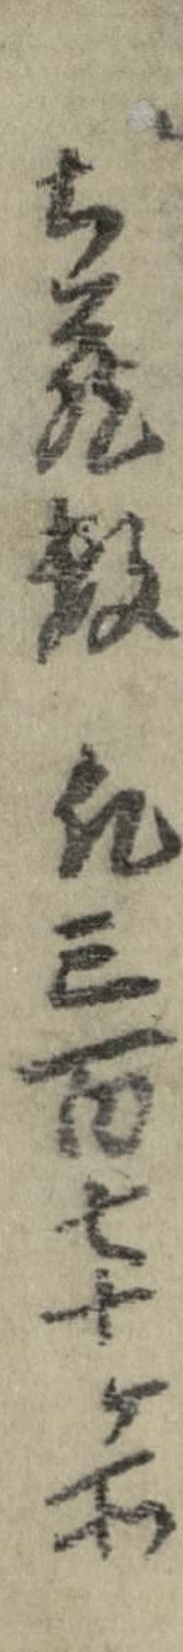土蔵数凡三百七十ケ所
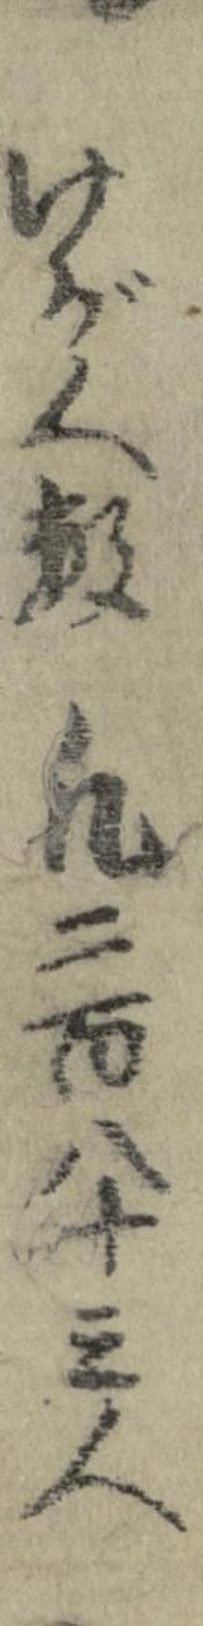けが人数凡二百八十三人
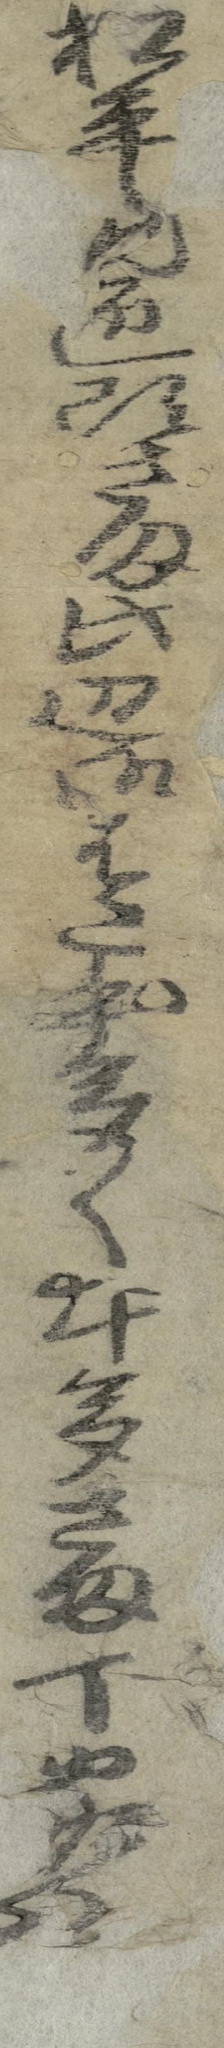松平内匠頭さま此辺御はた本多く本多様丁やしき
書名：焼場方角場所附
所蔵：東京大学地震研究所図書室 Earthquake Research Institute Library, The University of Tokyo, JAPAN
